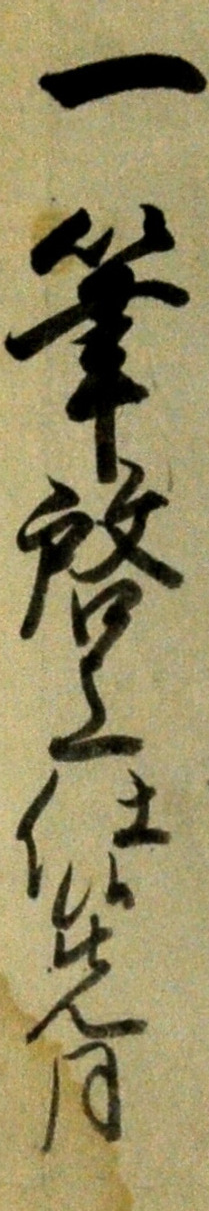一筆啓上仕候先月
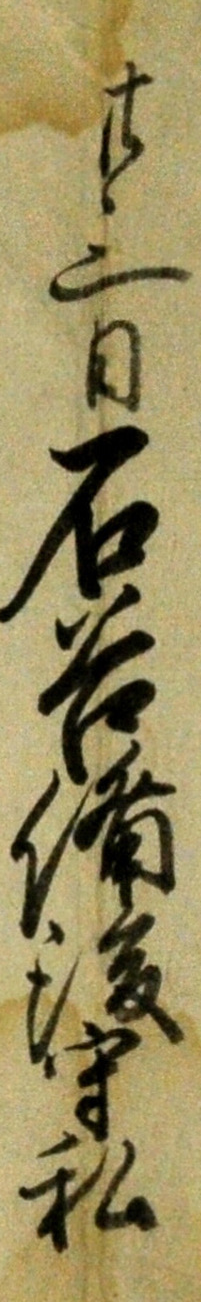廿三日石谷備後守私
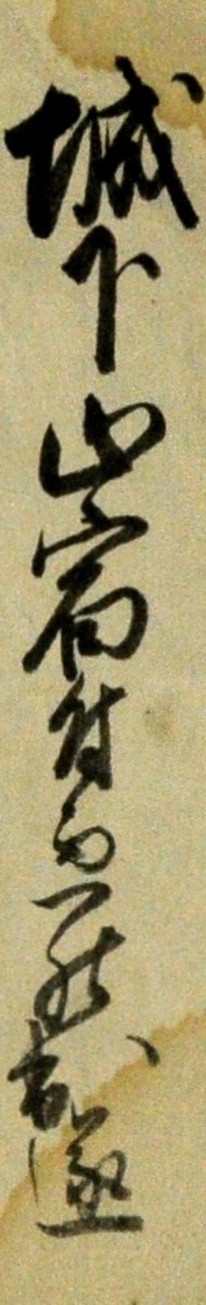城下止宿付て罷出遂
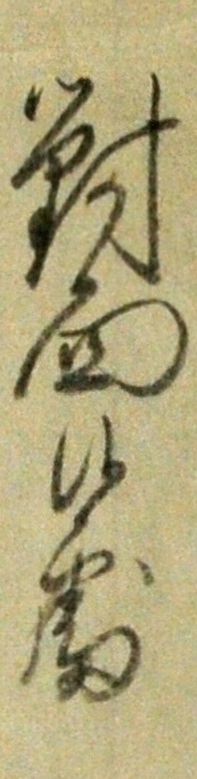対面候処
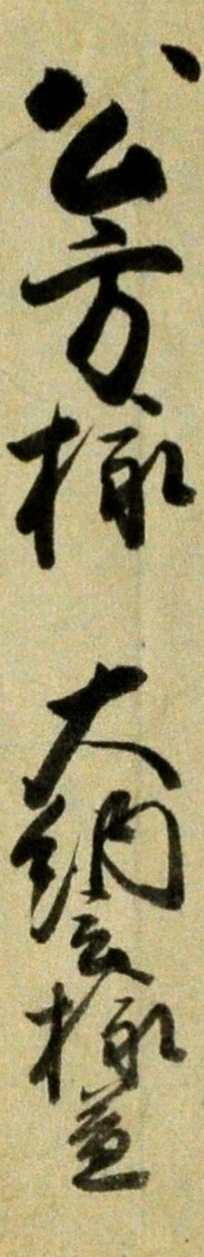公方様大納言様益
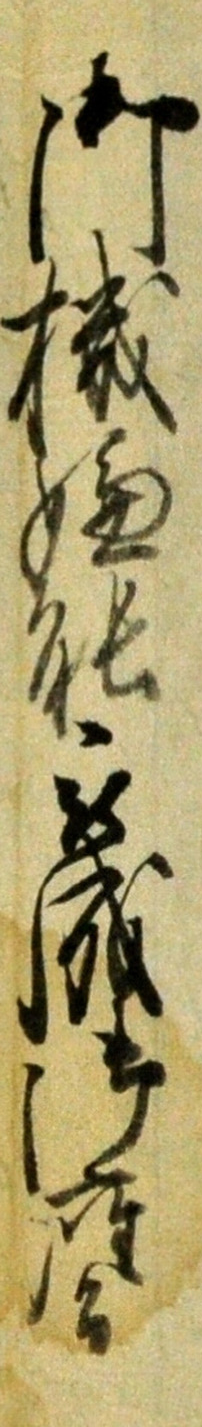御機嫌能被成御座間
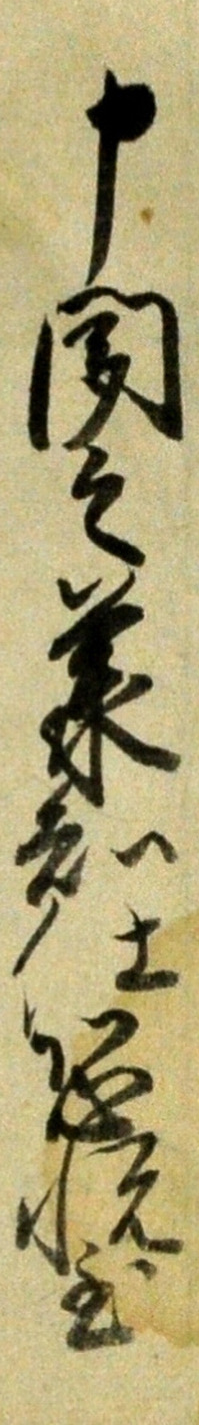申聞之承知仕恐悦至
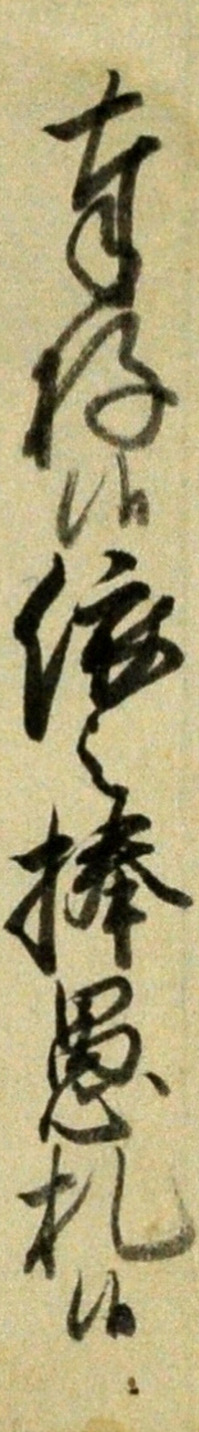奉存候依之捧愚札候
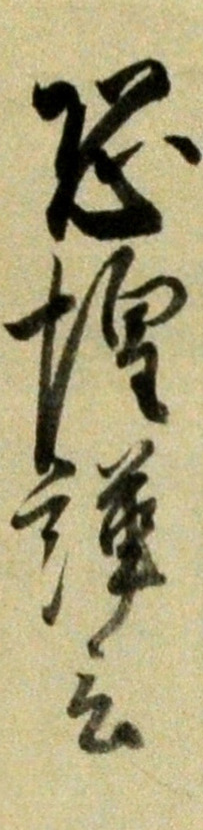恐惶謹言
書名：書状
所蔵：伊那市立高遠町図書館・合同会社AMANE
